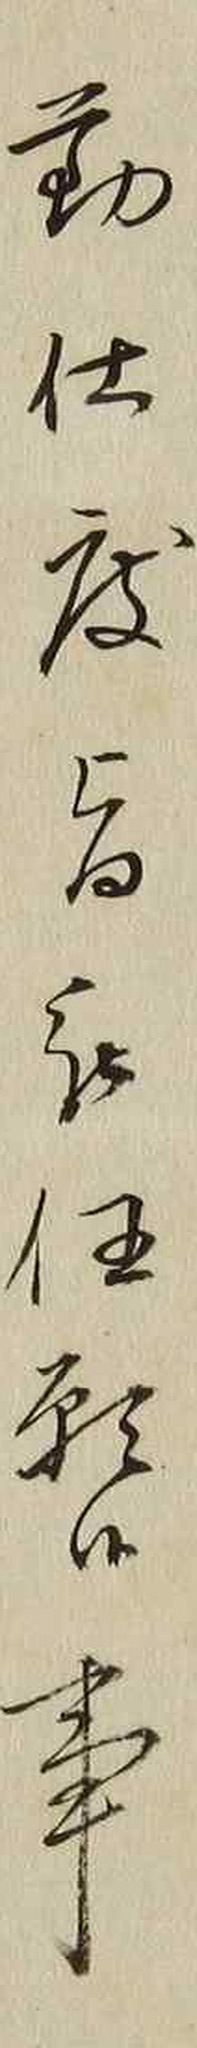勤仕度旨被任願候事
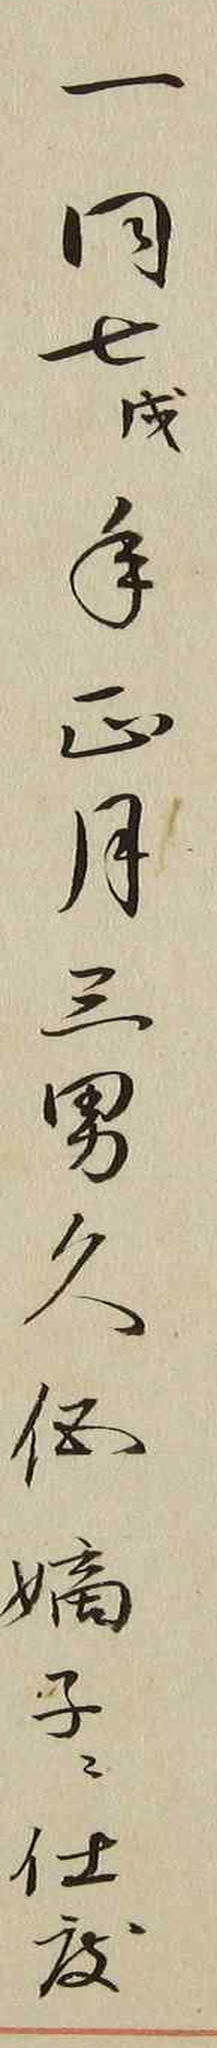一同七戌年正月三男久伍嫡子ニ仕度
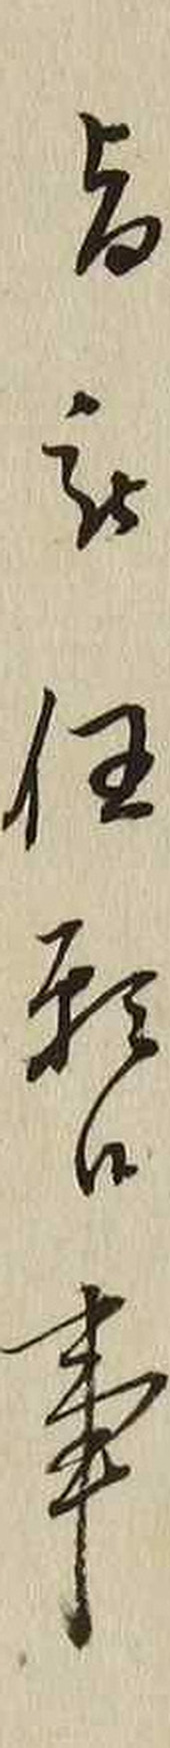旨被任願候事
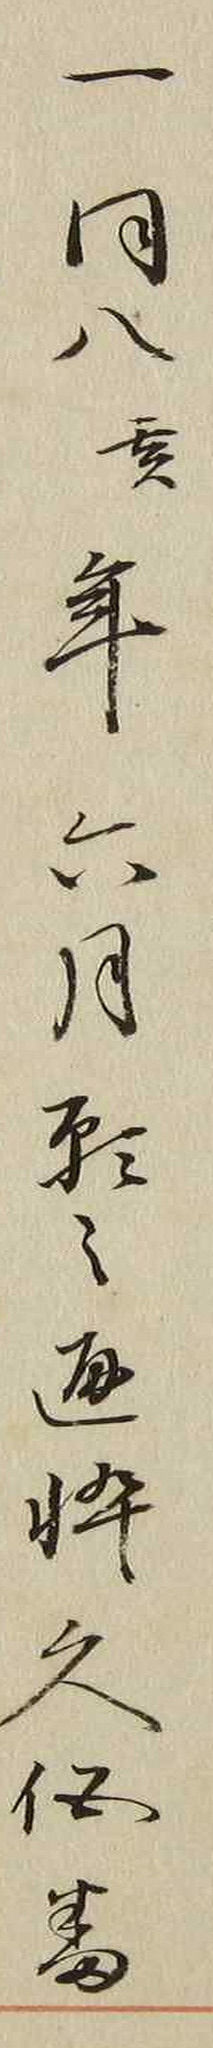一同八亥年六月願々通忰久伍番
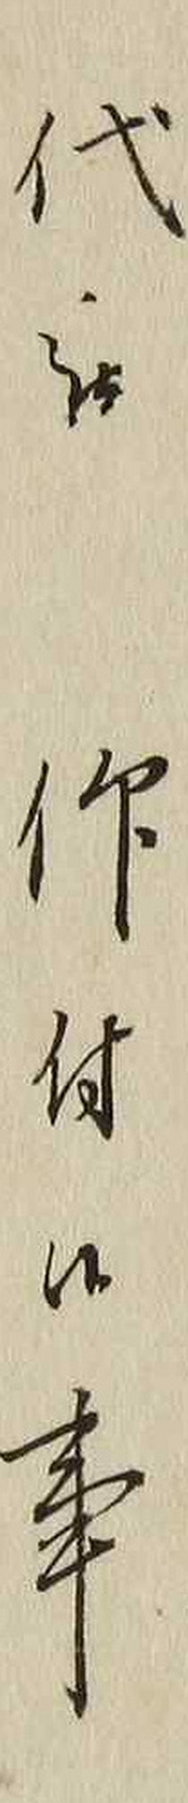代被仰付候事
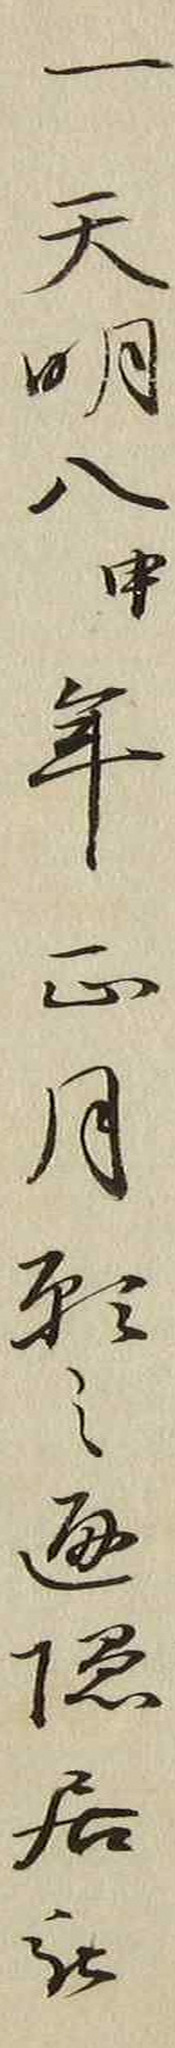一天明八申年正月願之通隠居被
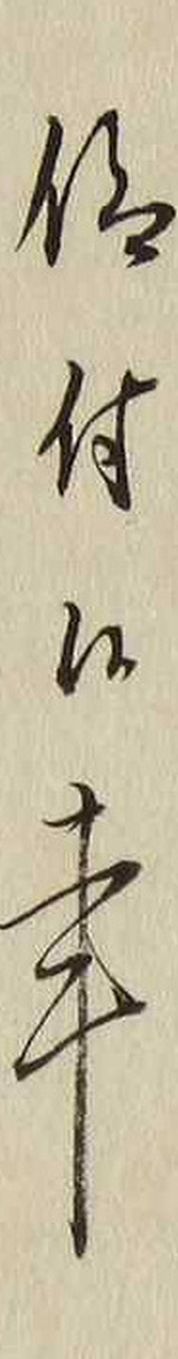仰付候事
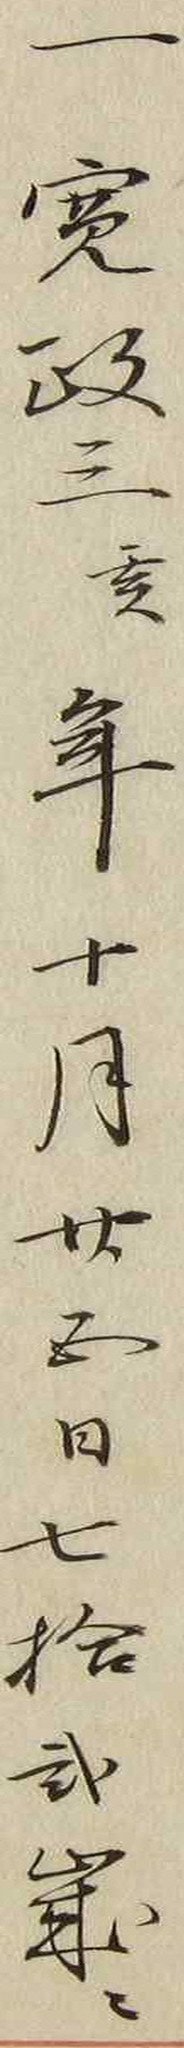一寛政三亥年十月廿五日七拾弐歳ニ
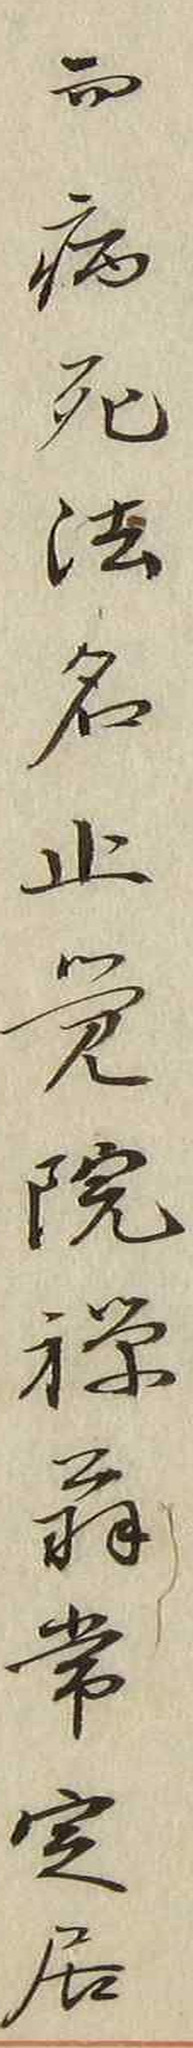而病死法名止覚院禅翁常定居
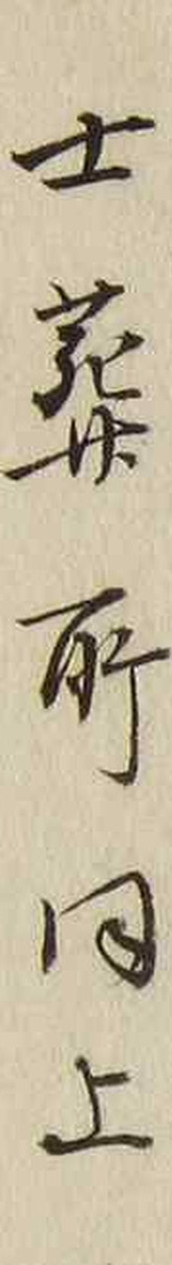士葬所同上

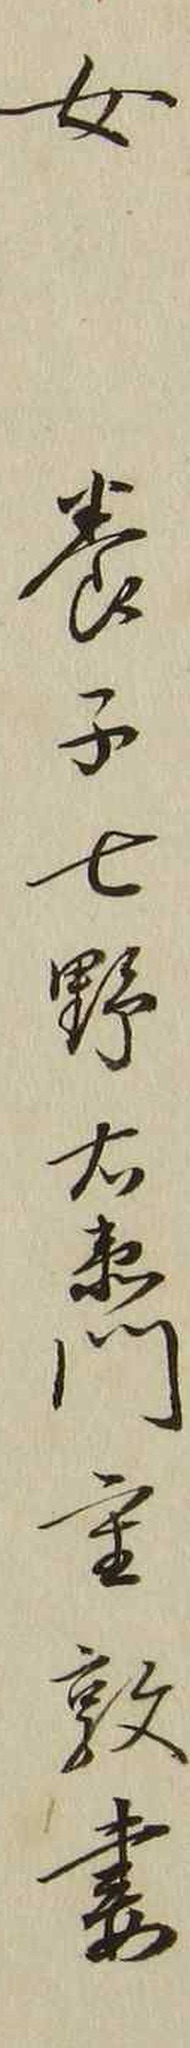女養子七野右衛門重敦妻
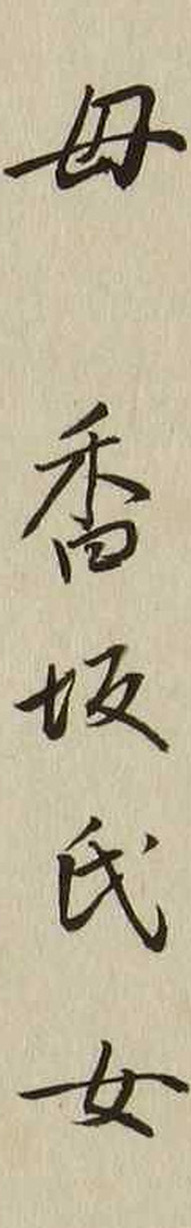母香坂氏女
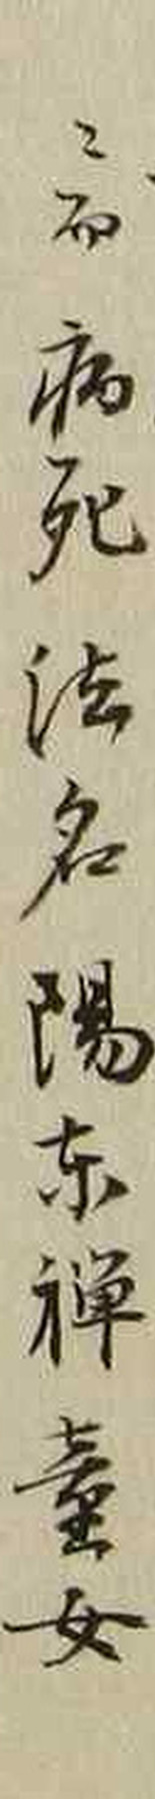ニ而病死法名陽東禅童女
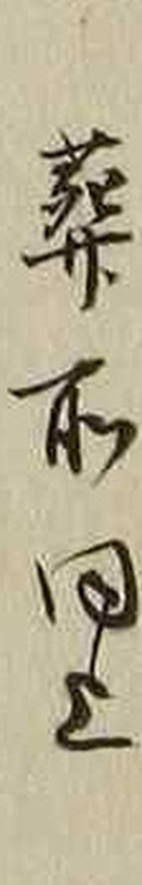葬所同上
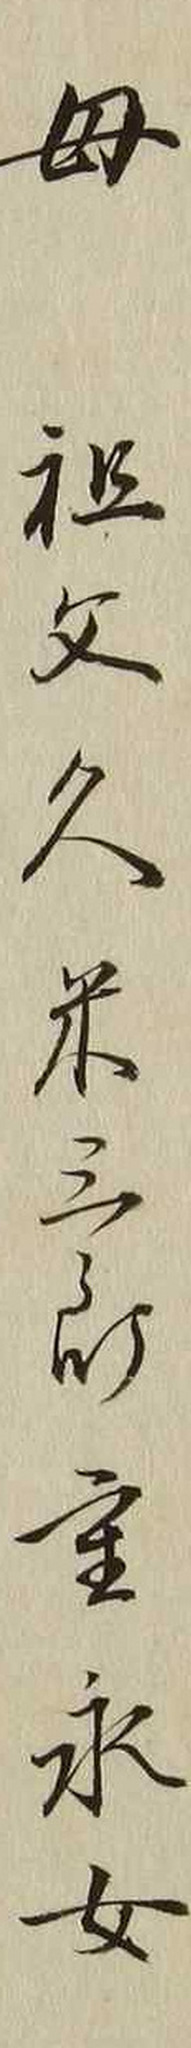母祖文久米三郎重永女
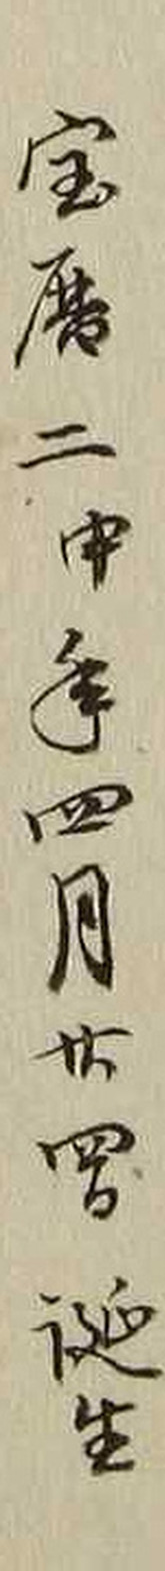宝暦二申年四月廿四日誕生
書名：諸士系譜　巻之22　い之部22
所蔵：会津若松市立会津図書館
